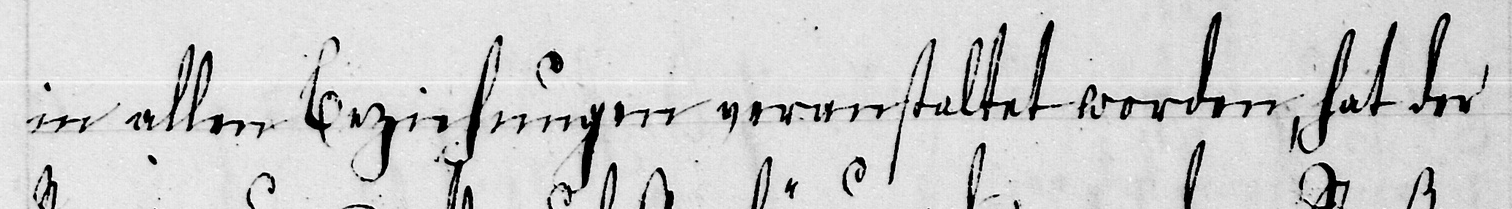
in allen Beziehungen veranstaltet worden, hat der
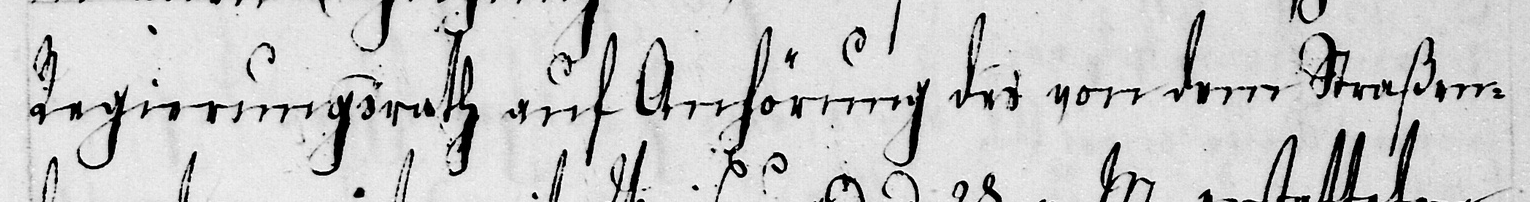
Regierungsrath auf Anhörung des von dem Straßen¬
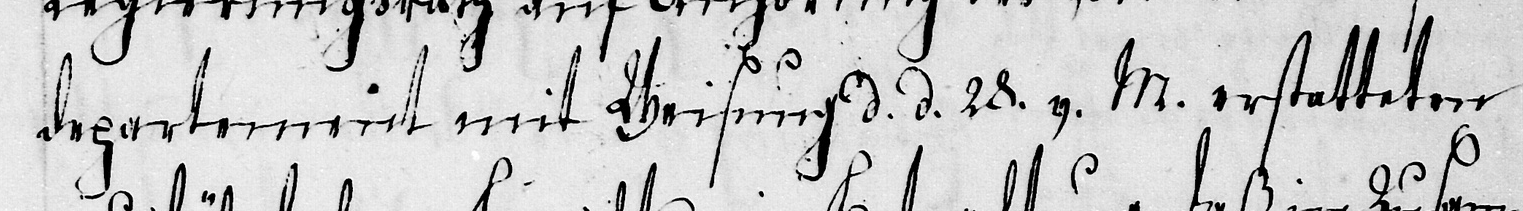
departement mit Weisung d. d. 28. v. M. erstatteten
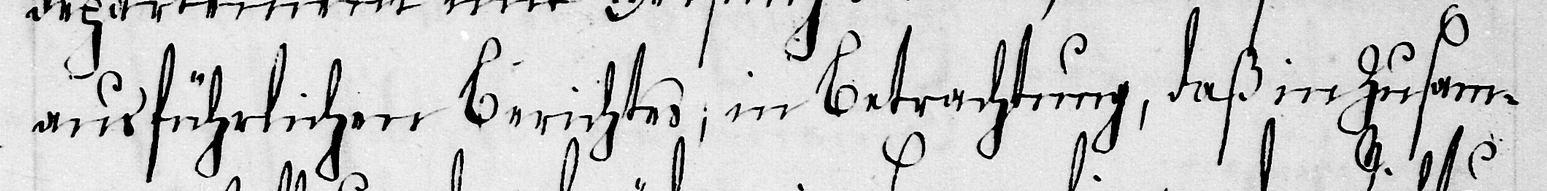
ausführlichen Berichtes; in Betrachtung, daß in Zusam¬
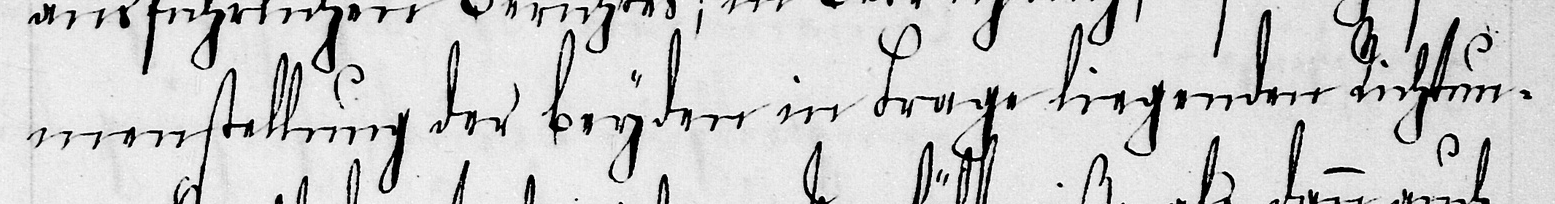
menstellung der beyden in Frage liegenden Richtun¬
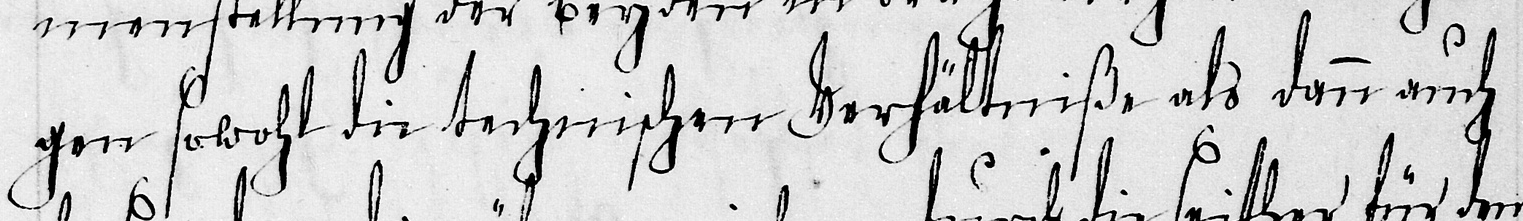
gen sowohl die technischen Verhältniße als dann auch
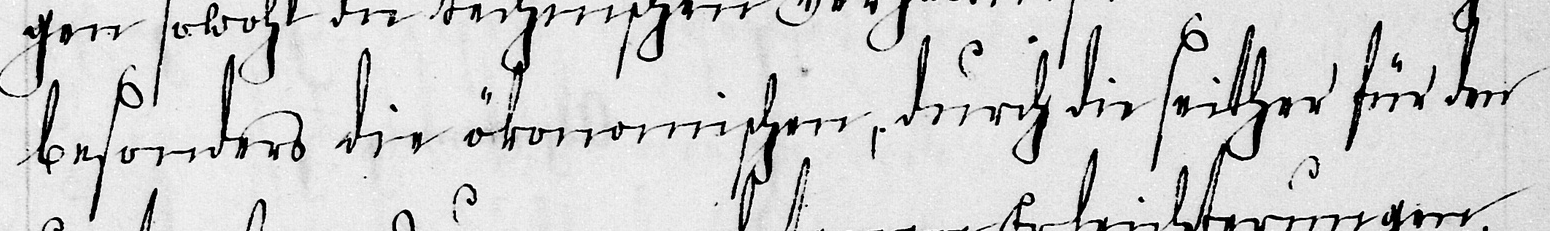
besonders die ökonomischen, durch die seither für den
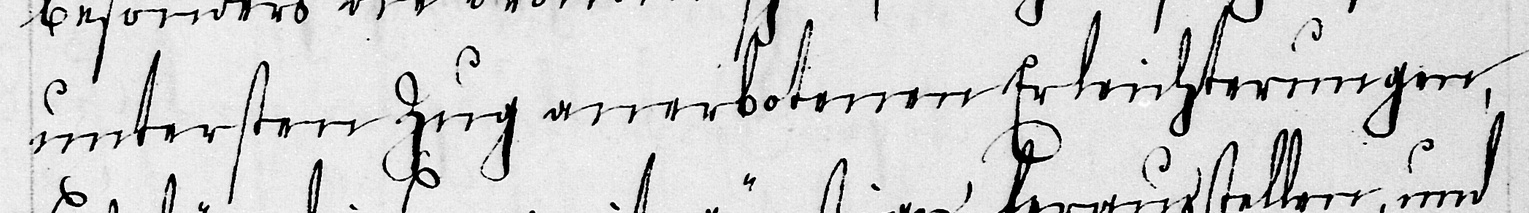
untersten Zug anerbotenen Erleichterungen,
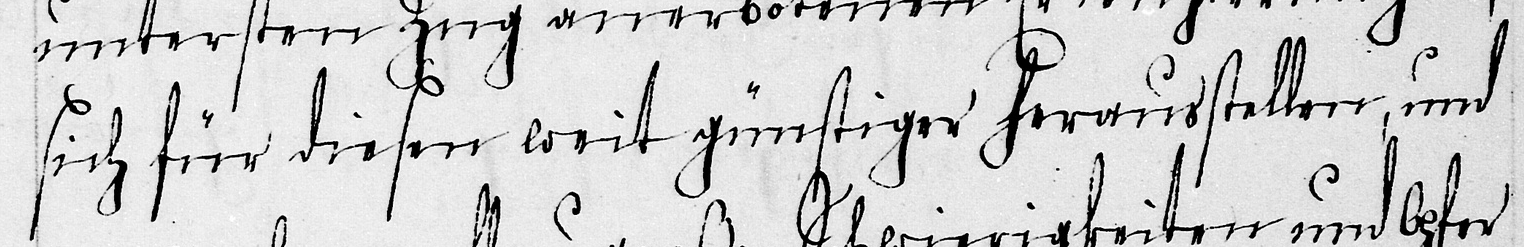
sich für diesen weit günstiger herausstellen, und
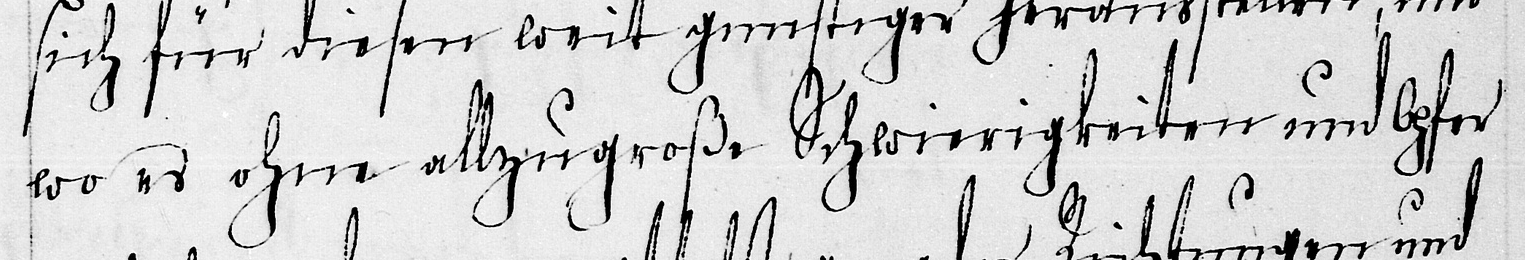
wo es ohne allzugroße Schwierigkeiten und Opfer
